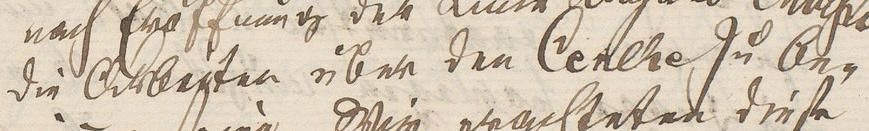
die Arbeiten über den Cenere zu be-
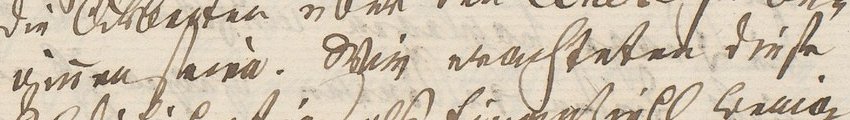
ginnen seien. Wir erachteten diese
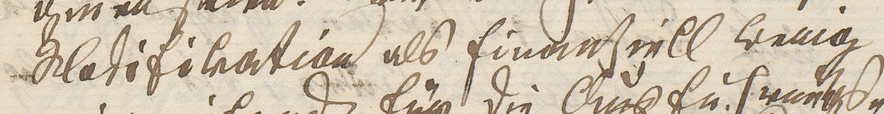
Modifikation als finanziell wenig
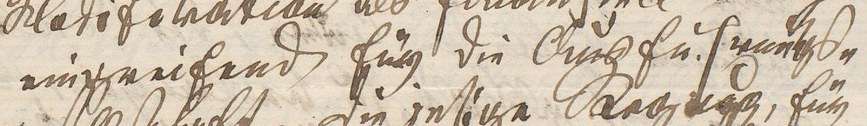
eingreifend für die Ausführungs-
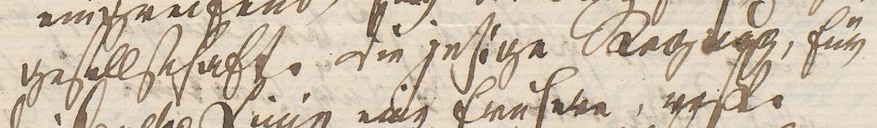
gesellschaft. Die jezige Regung, für
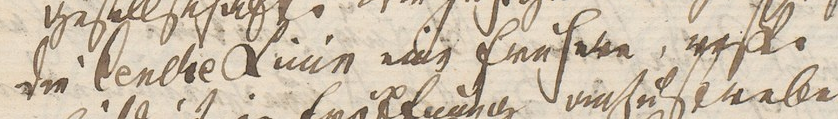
die Cenere Linie eine frühere, resp.
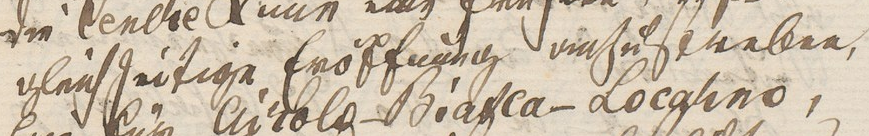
gleichzeitige Eröffnung anzustreben,
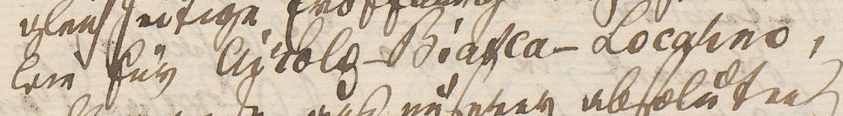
wie für Airolo – Biasca – Locarno,
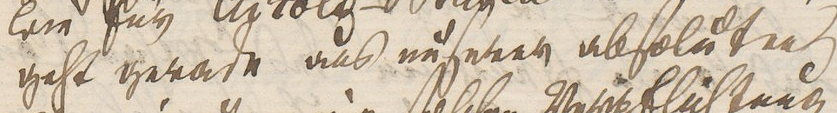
geht gerade aus unserer absoluten
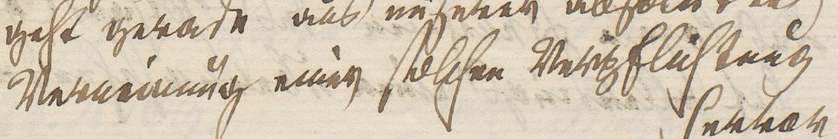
Verneinung einer solchen Verpflichtung
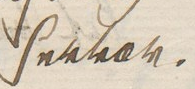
hervor.
